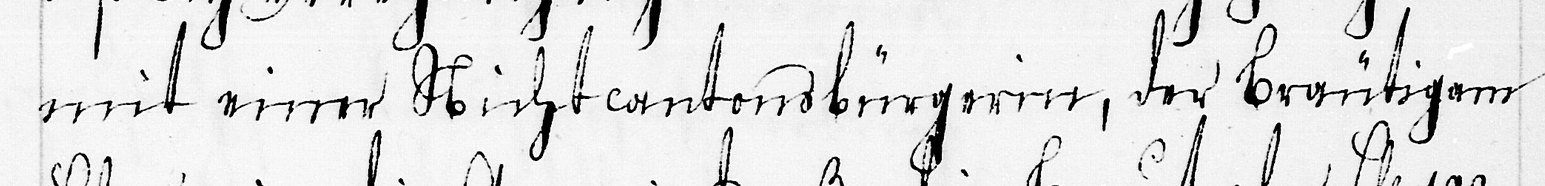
mit einer Nichtcantonsbürgerin, der Bräutigam
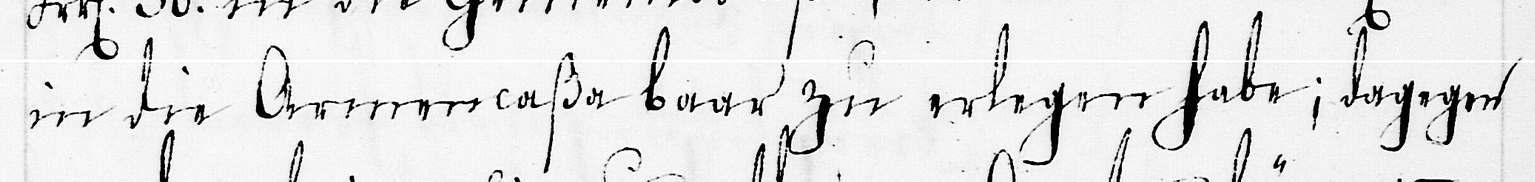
in die Armencaßa baar zu erlegen habe; dagegen
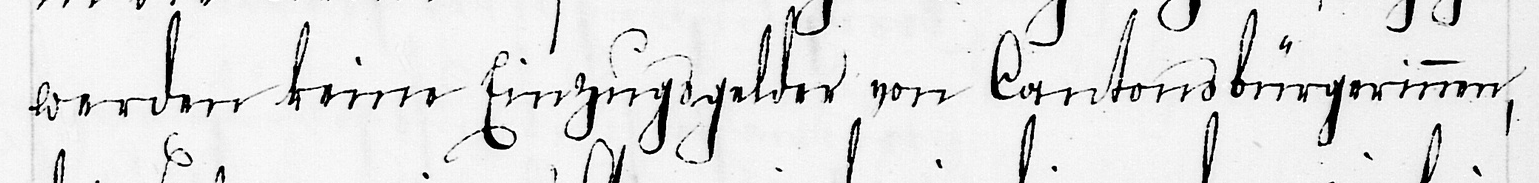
werden keine Einzugsgelder von Cantonsbürgerinnen,
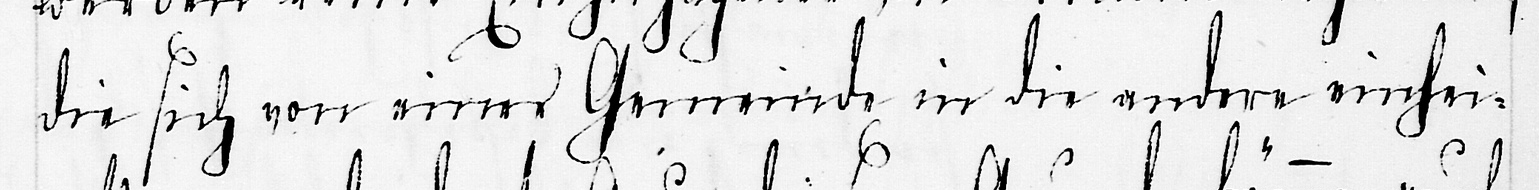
die sich von einer Gemeinde in die andere einhei¬
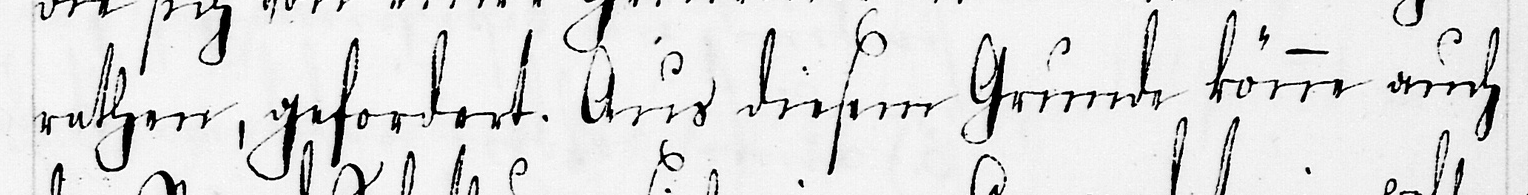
rathen, gefordert. Aus diesem Grunde könne auch
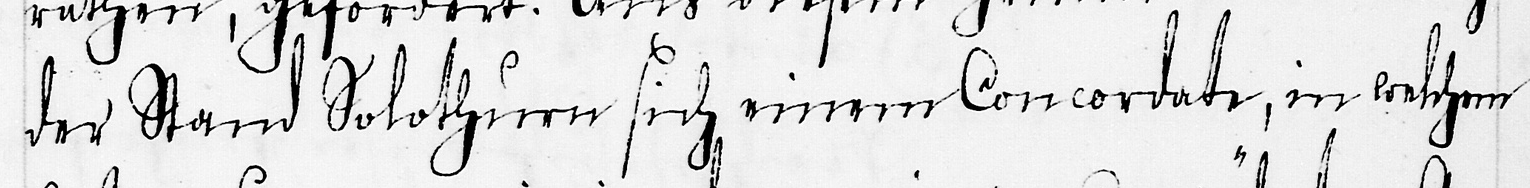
der Stand Solothurn sich einem Concordate, in welchem
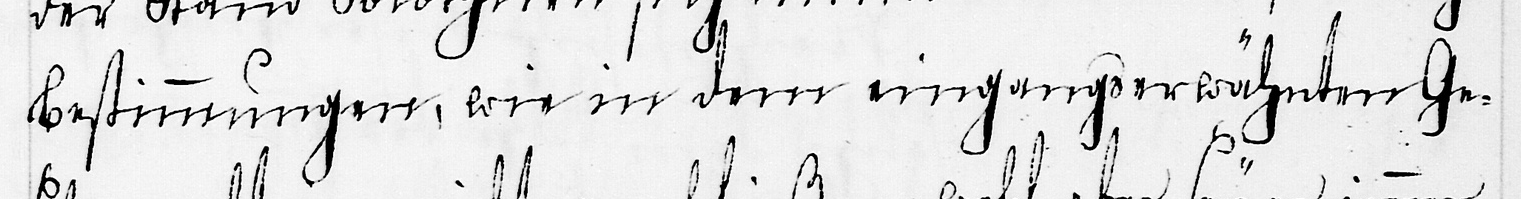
Bestimmungen, wie in dem eingangserwähnten Ge¬
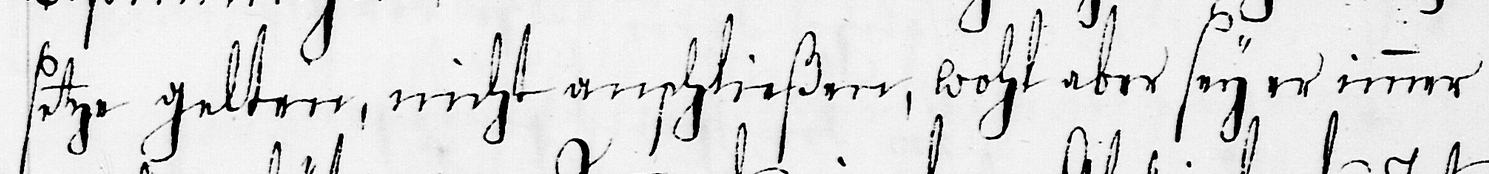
setze gelten, nicht anschließen, wohl aber sey er immer
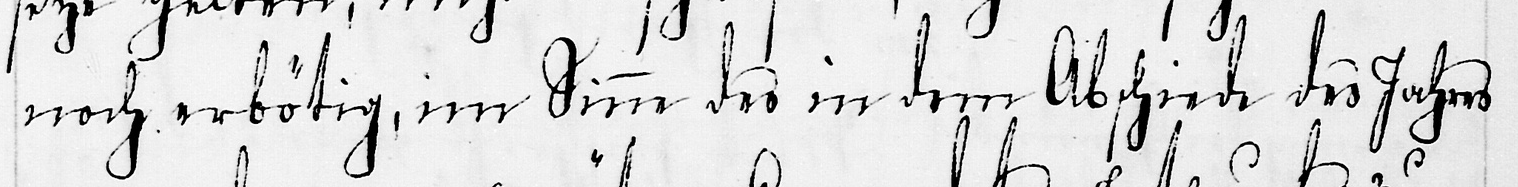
noch erbötig, im Sinne des in dem Abschiede des Jahres
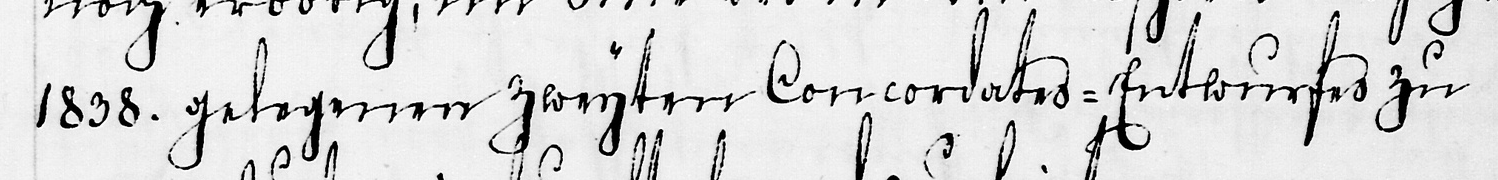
1838. gelegenen zweyten Concordates-Entwurfes zu
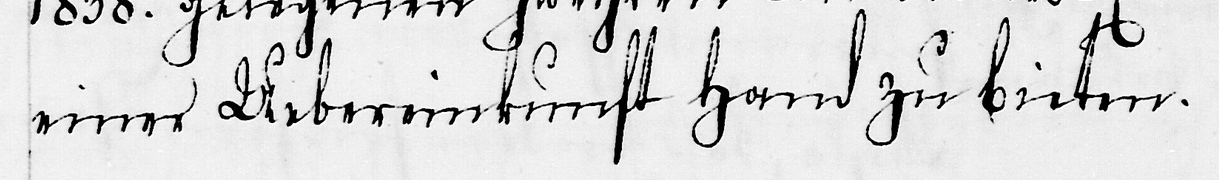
einer Uebereinkunft Hand zu bieten.
